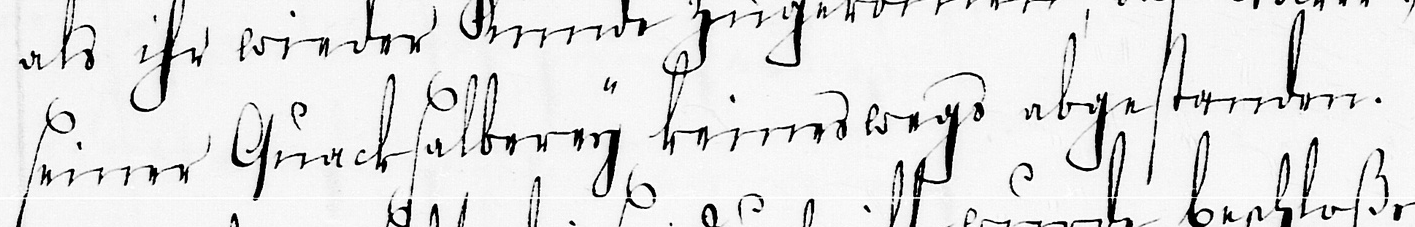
seiner Quacksalberey keineswegs abgestanden.
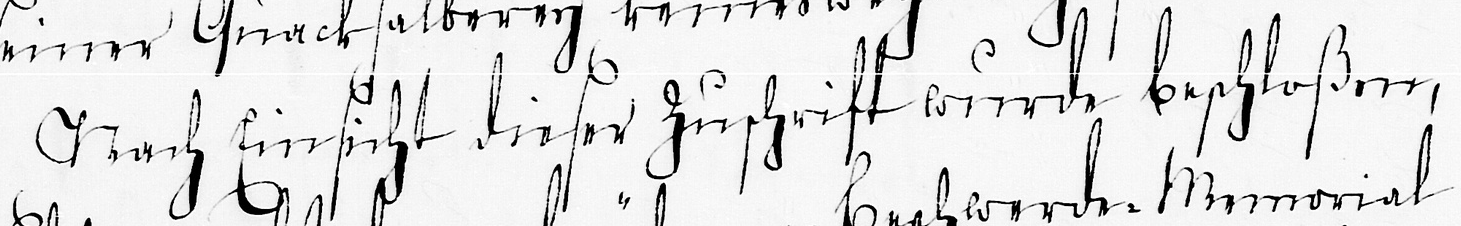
Nach Einsicht dieser Zuschrift wurde beschloßen,
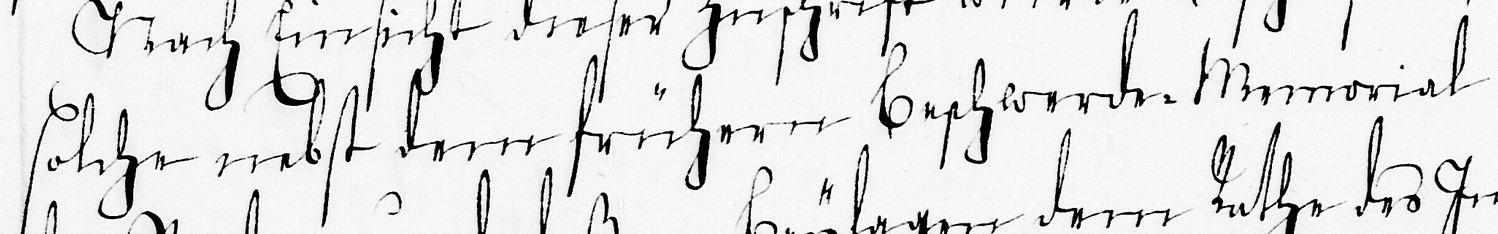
solche nebst dem frühern Beschwerde-Memorial
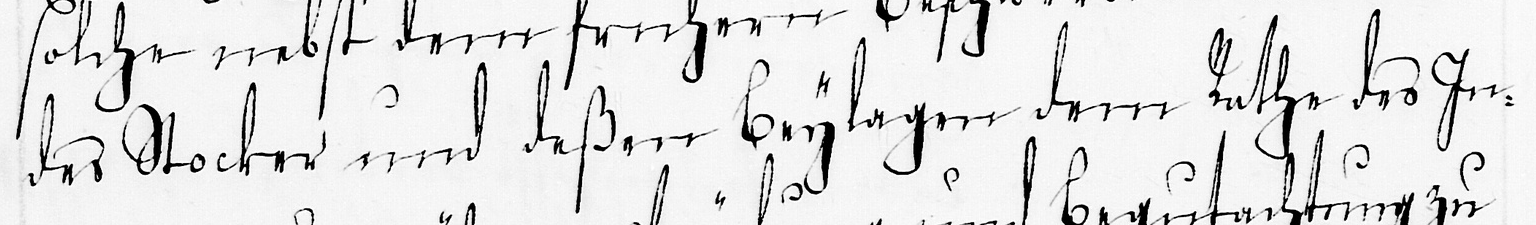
des Stocker und deßen Beylagen dem Rathe des In¬
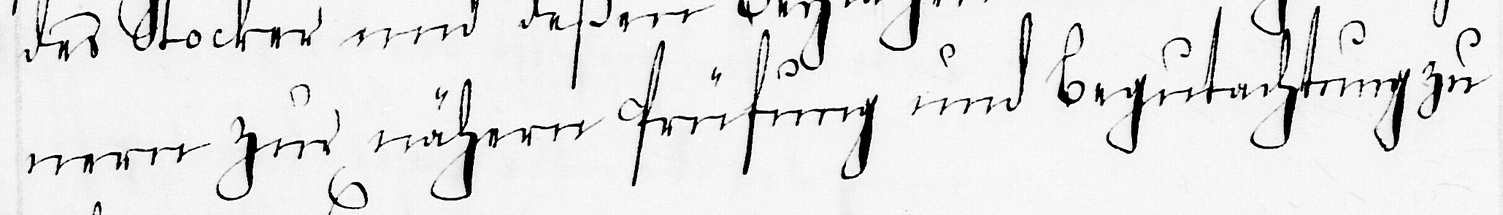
nern zur nähern Prüfung und Begutachtung zu
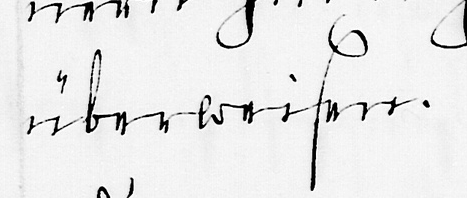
überweisen.
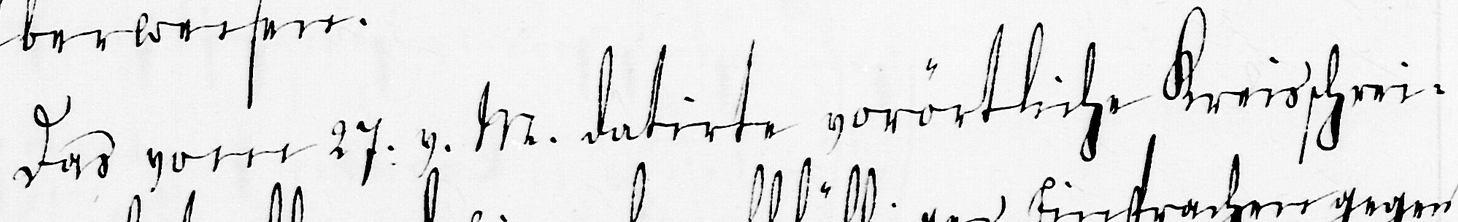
Das vom 27. v. M. datirte vorörtliche Kreisschrei¬
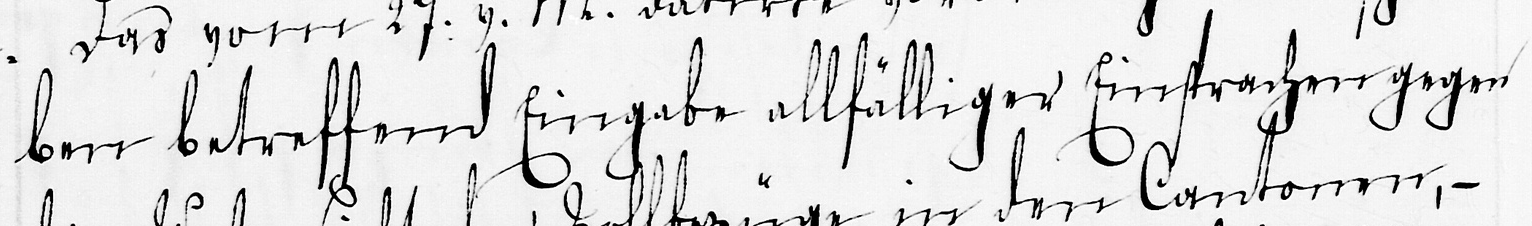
ben betreffend Eingabe allfälliger Einsprachen gegen
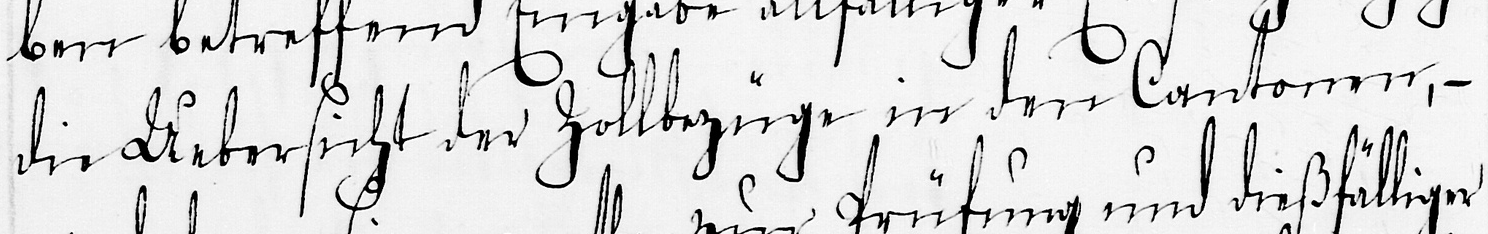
die Uebersicht der Zollbezüge in den Cantonen, –
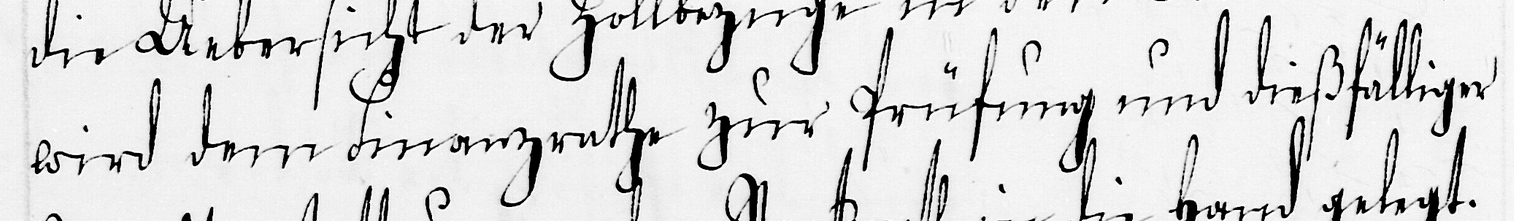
wird dem Finanzrathe zur Prüfung und dießfällig¬
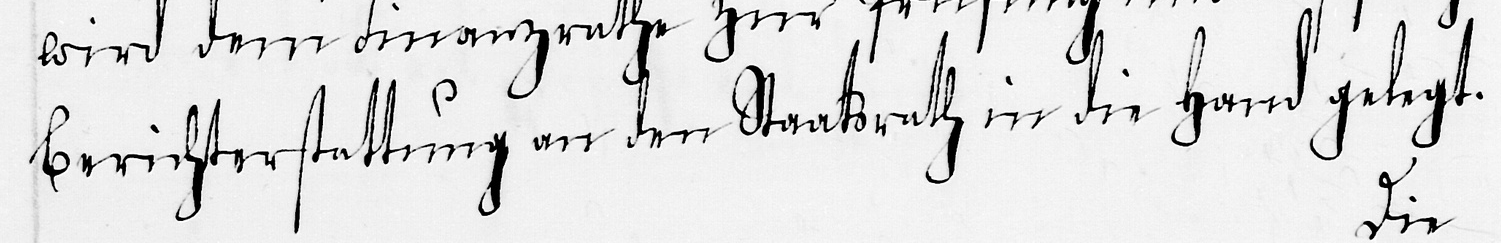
Berichterstattung an den Staatsrath in die Hand gelegt.
